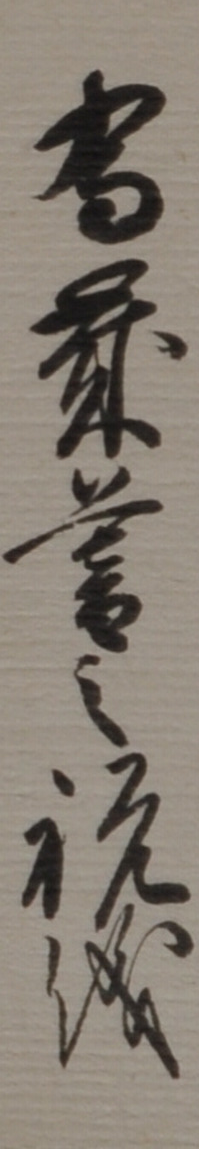為歳暮之祝儀
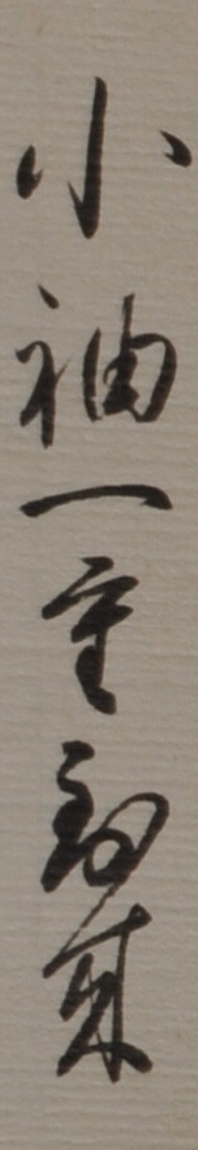小袖一重到来
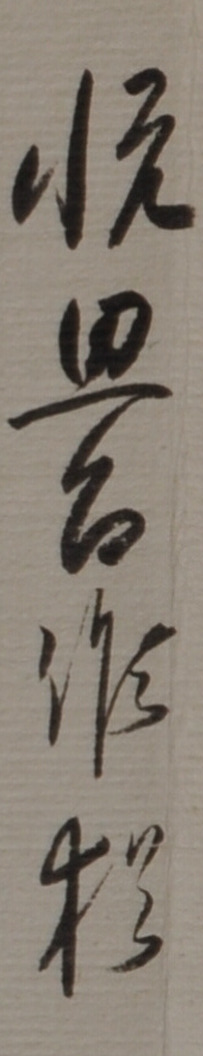悦思召候猶
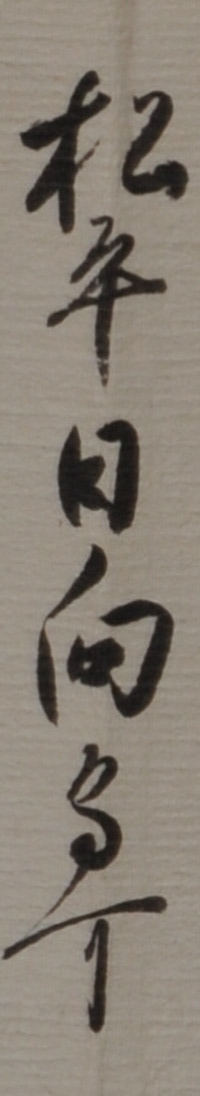松平日向守可
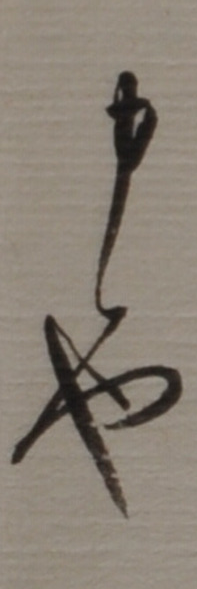申候也
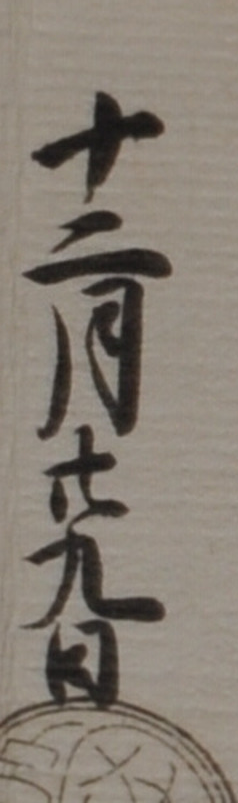十二月廿九日
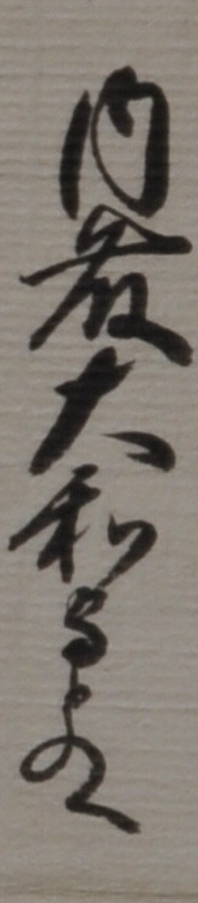内藤大和守とのへ
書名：御内書
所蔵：伊那市立高遠町図書館・合同会社AMANE
